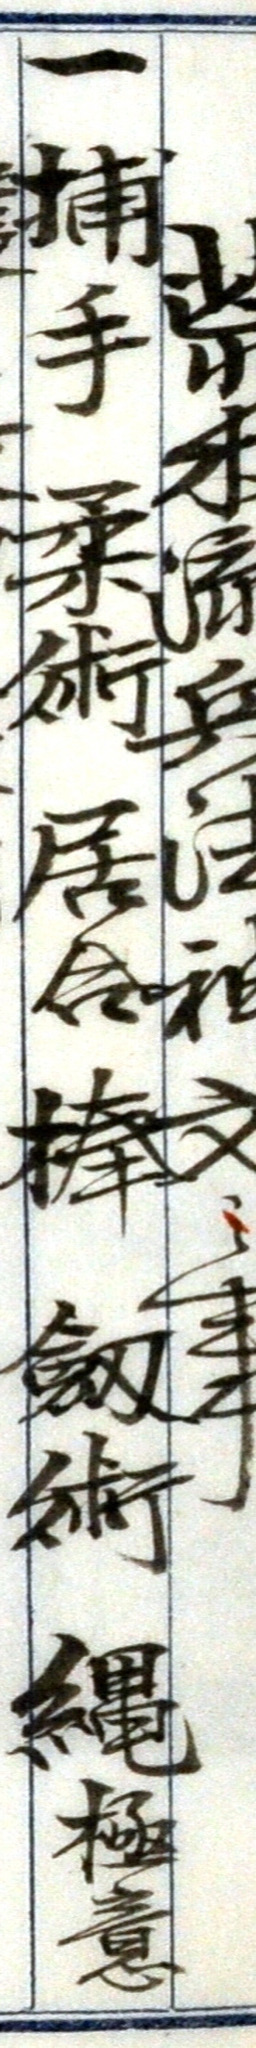一捕手柔術居合棒剣術縄極意
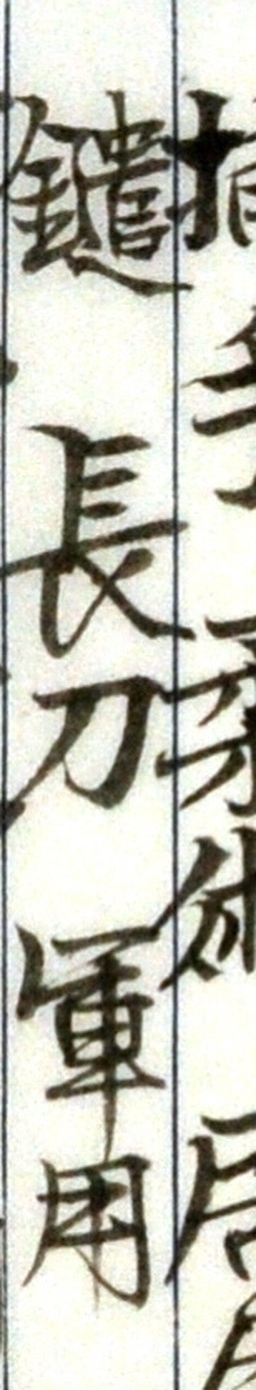鑓長刀軍用
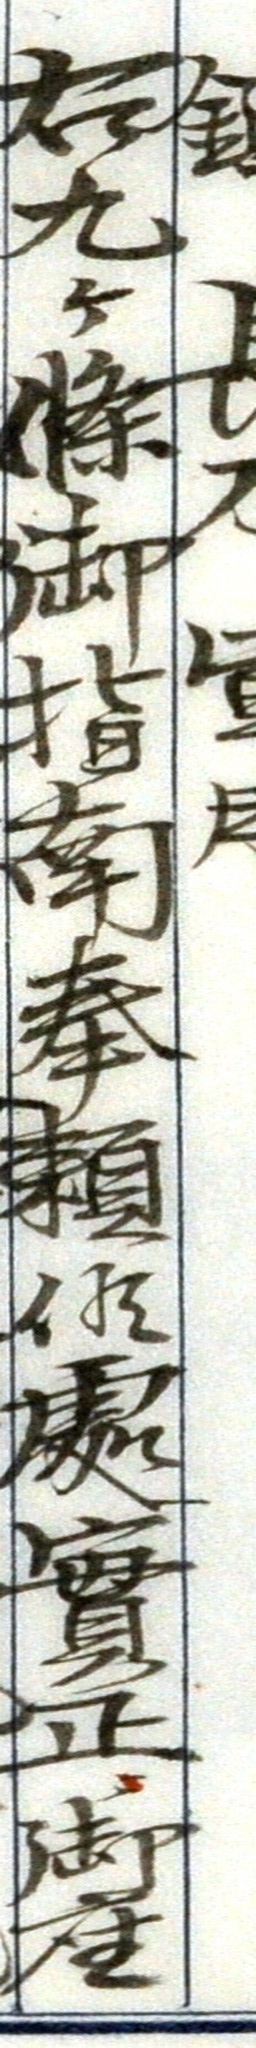右九ヶ條御指南奉頼候処実正御座
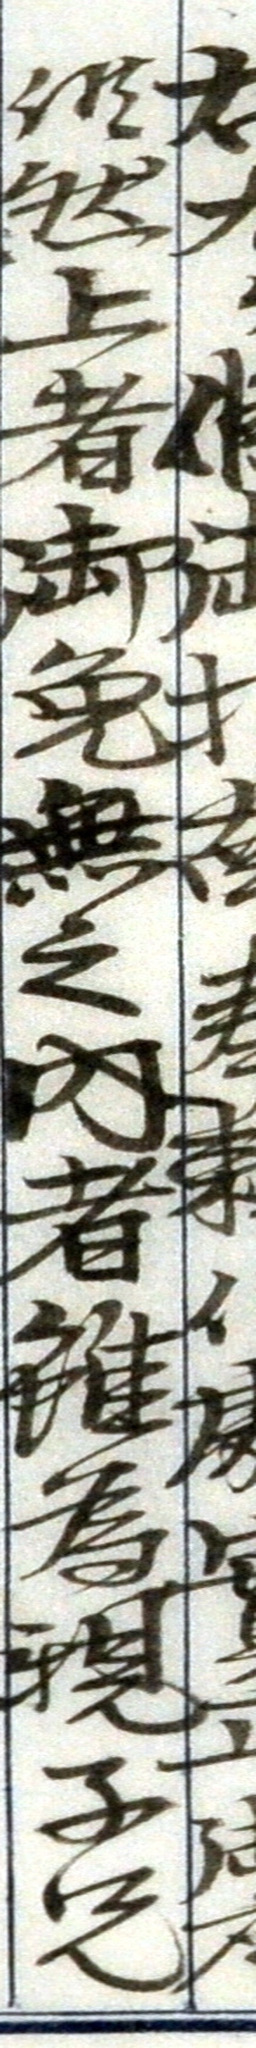候然上者御免無之内者雖為親子兄
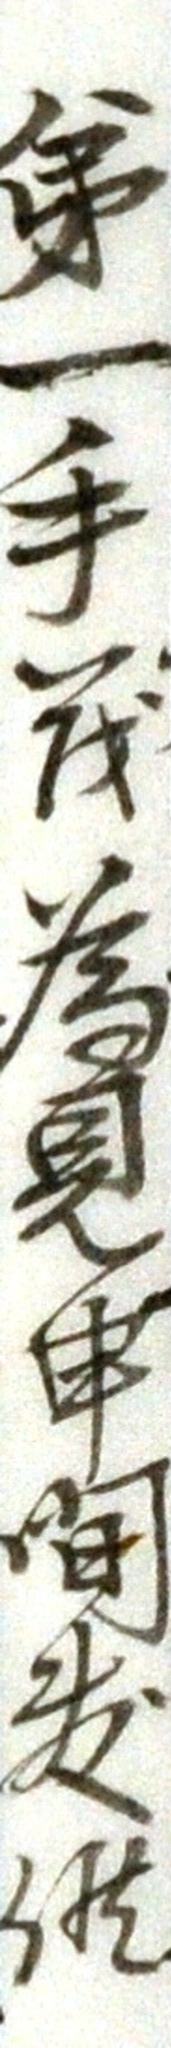弟一手茂為見申間敷候
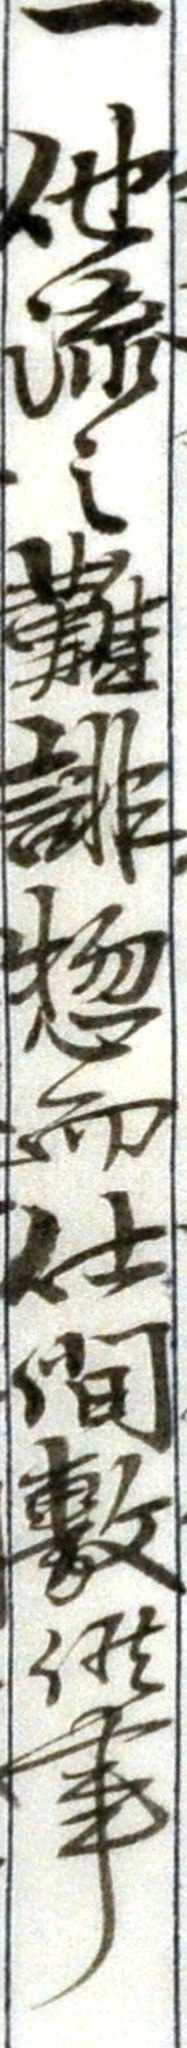一他流之難誹惣而仕間敷候事
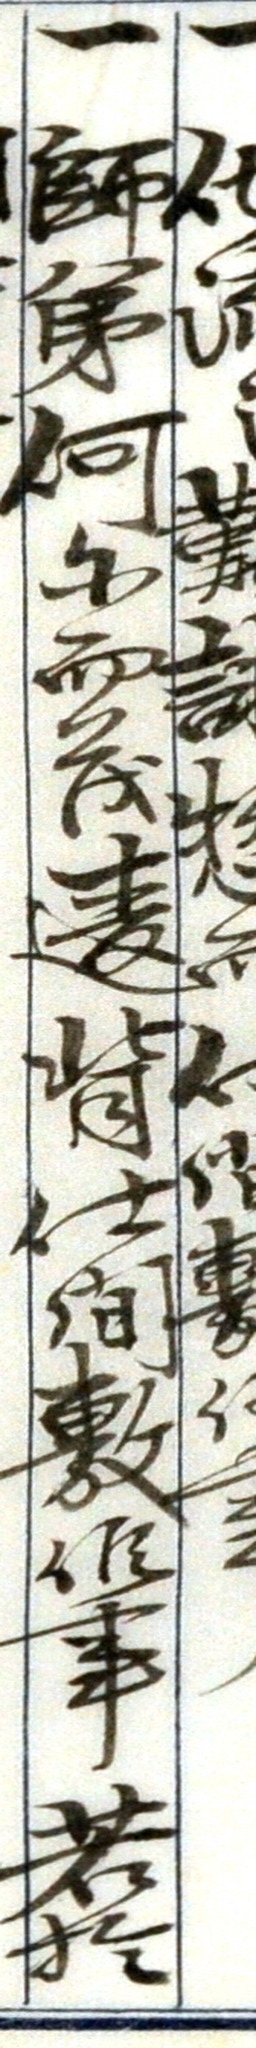一師弟何に而茂違背仕間敷候事若於
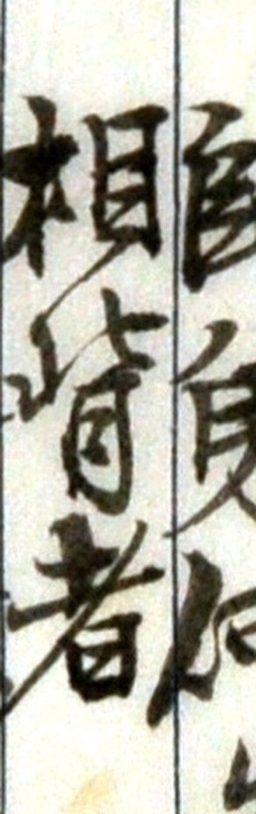相背者
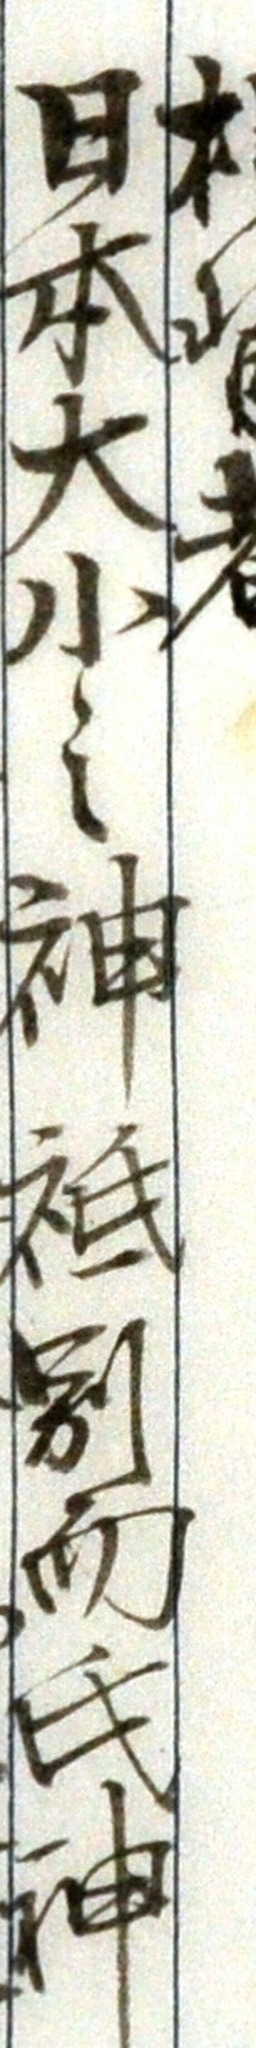日本大小之神祇別而氏神
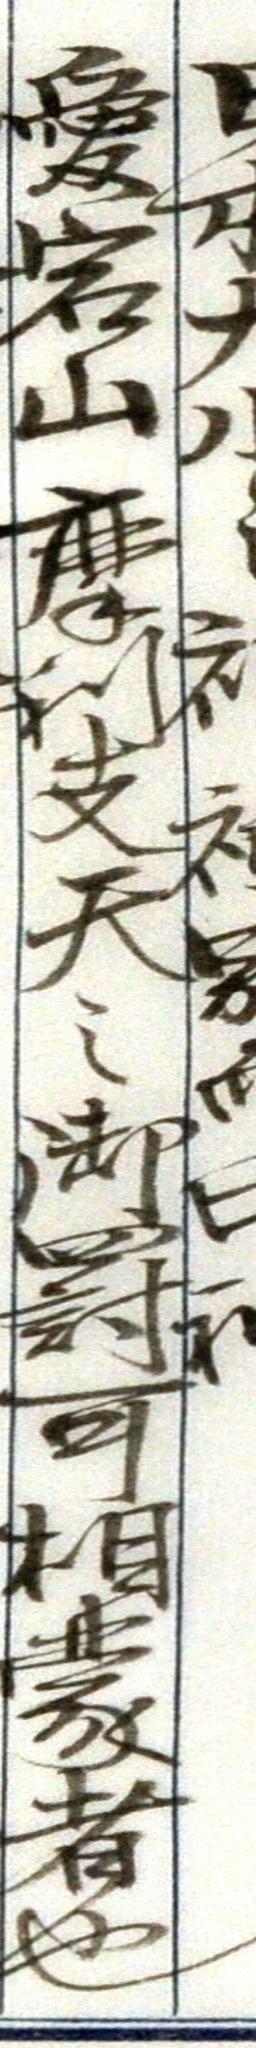愛宕山摩利支天之御罰可相蒙者也
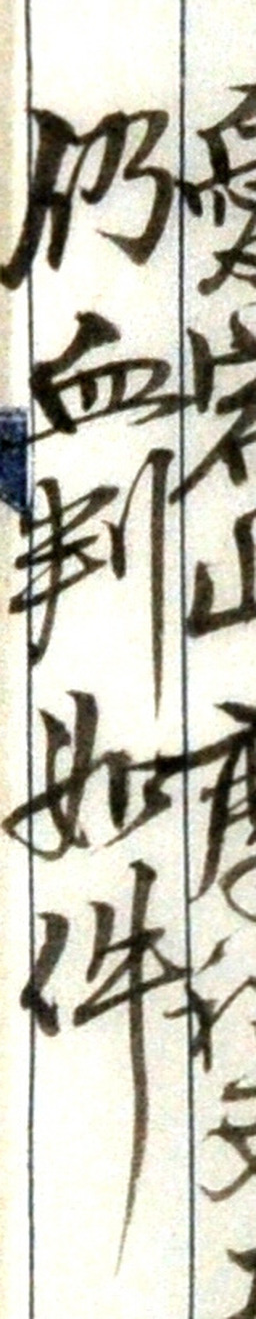仍血判如件

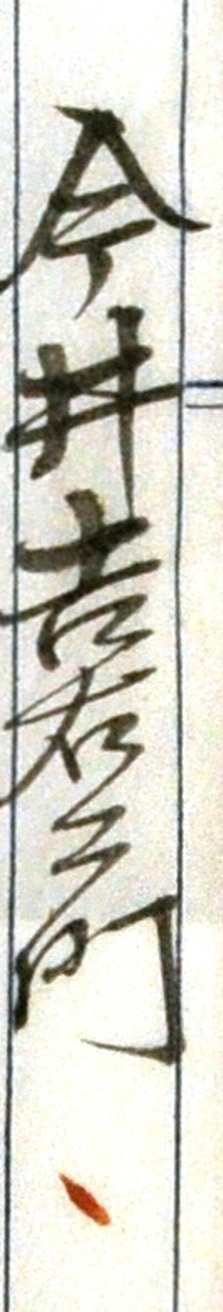今井吉右エ門
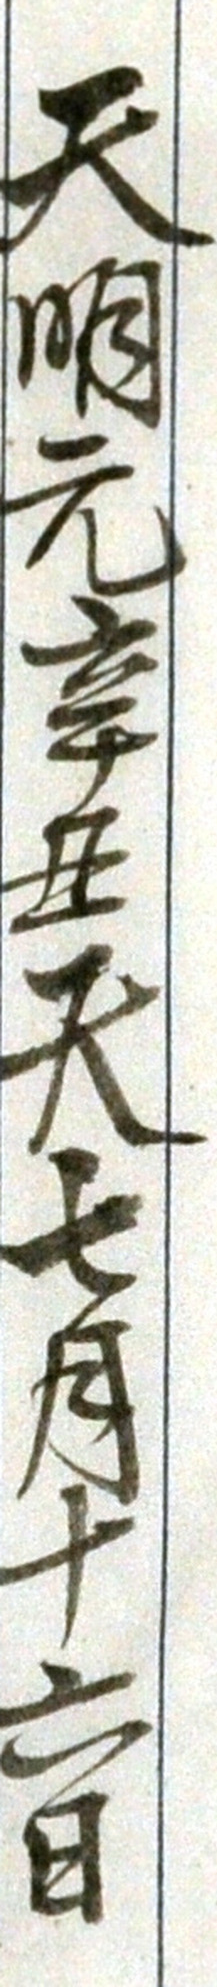天明元辛丑天七月十六日
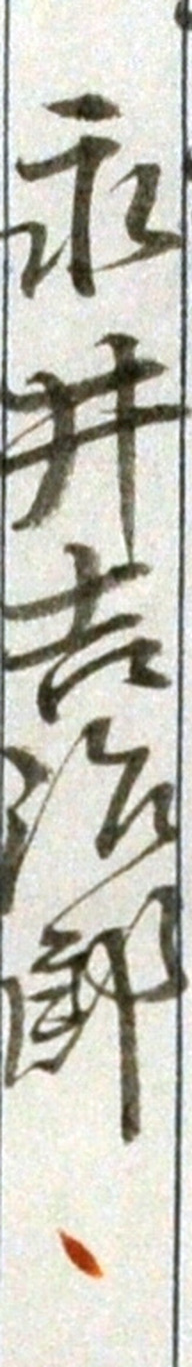永井吉次郎
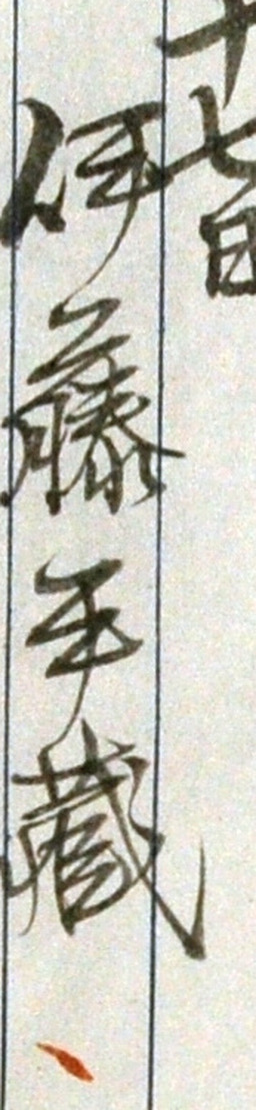伊藤平蔵
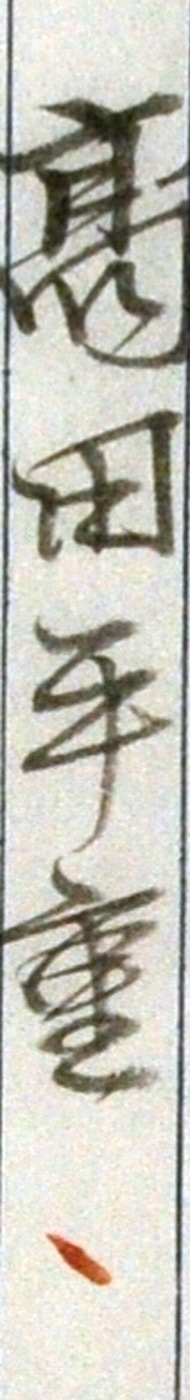高田平重
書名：竹内流・甲州流・荒木流・一刀流新当流起請文及免許写堤宝山流手鏡及個之大事
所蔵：伊那市立高遠町図書館・合同会社AMANE
